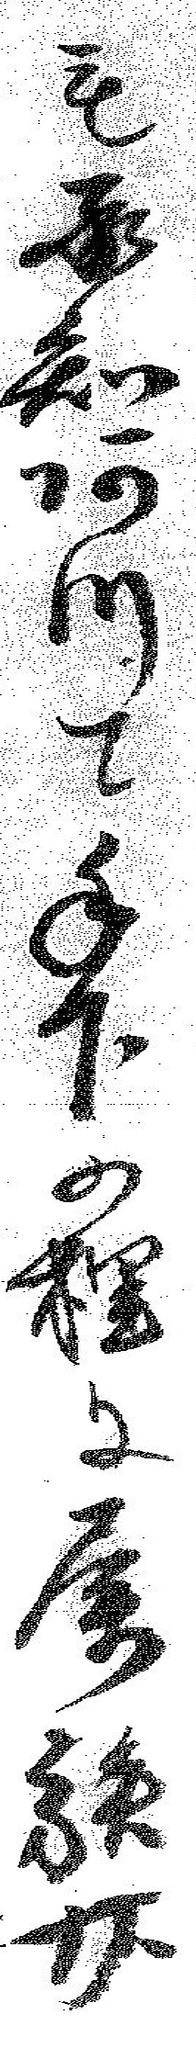も承知あつて手下の狸に属族廿
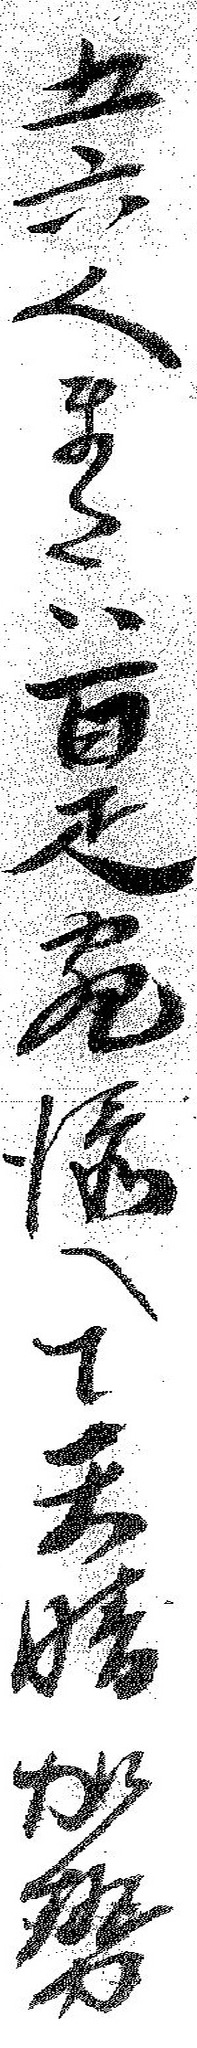五六人または百疋宛添へて天晴加勢
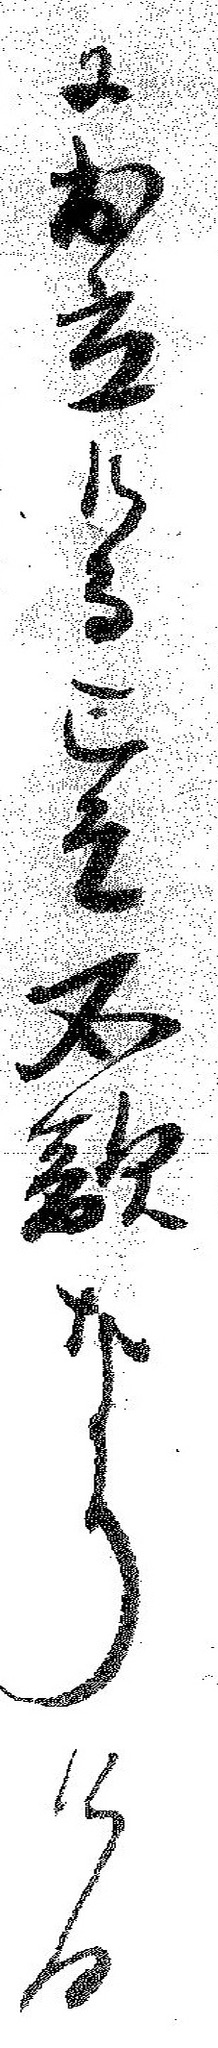に出立けるこそ不敵なりける
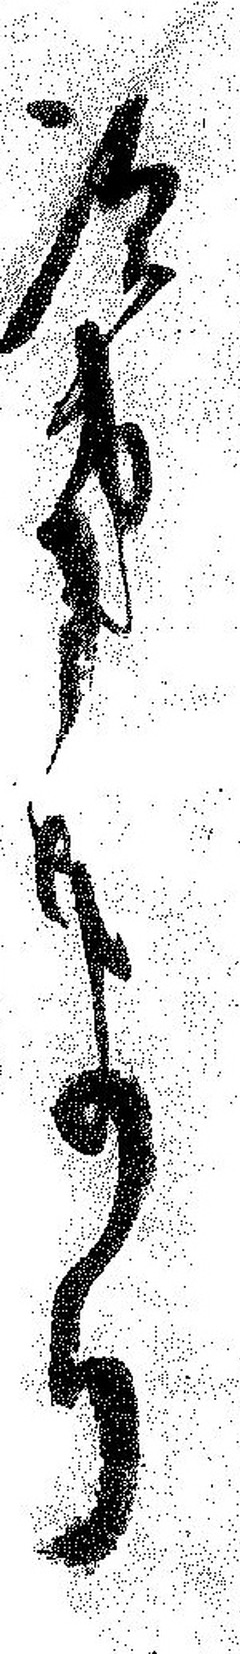次第なり

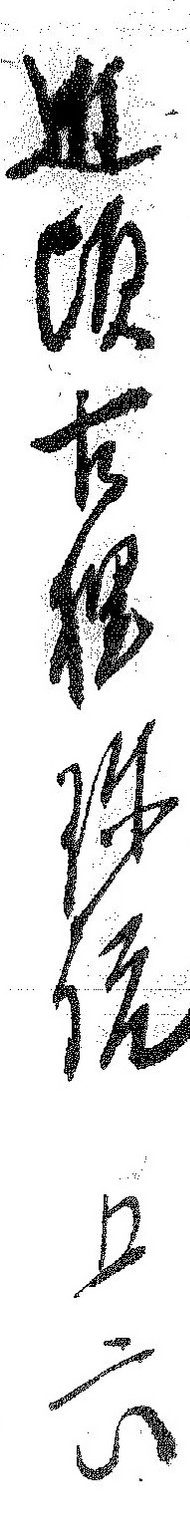近頃古狸珎説五六
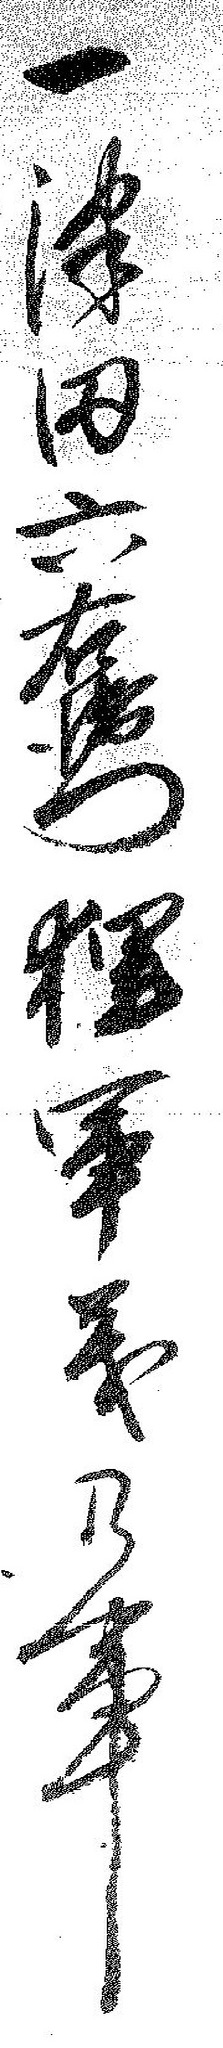一津田六右衛門狸軍義の事
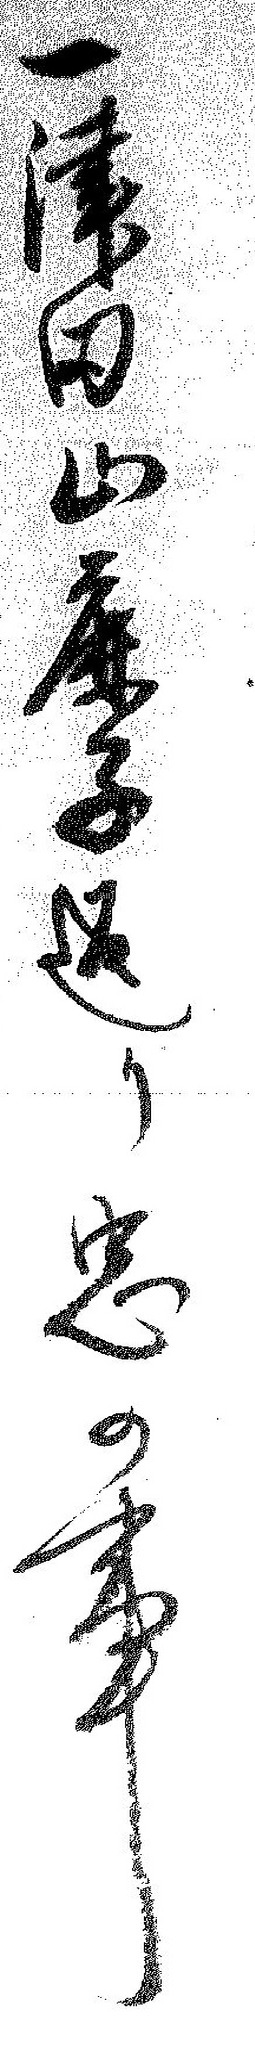一津田山鹿子返り忠の事
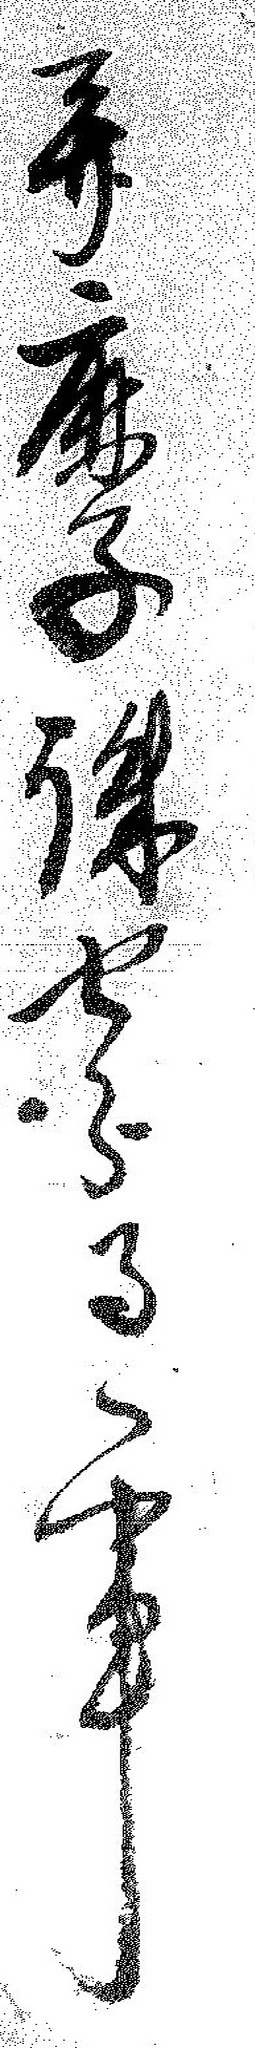幷鹿子誅せらるゝ事

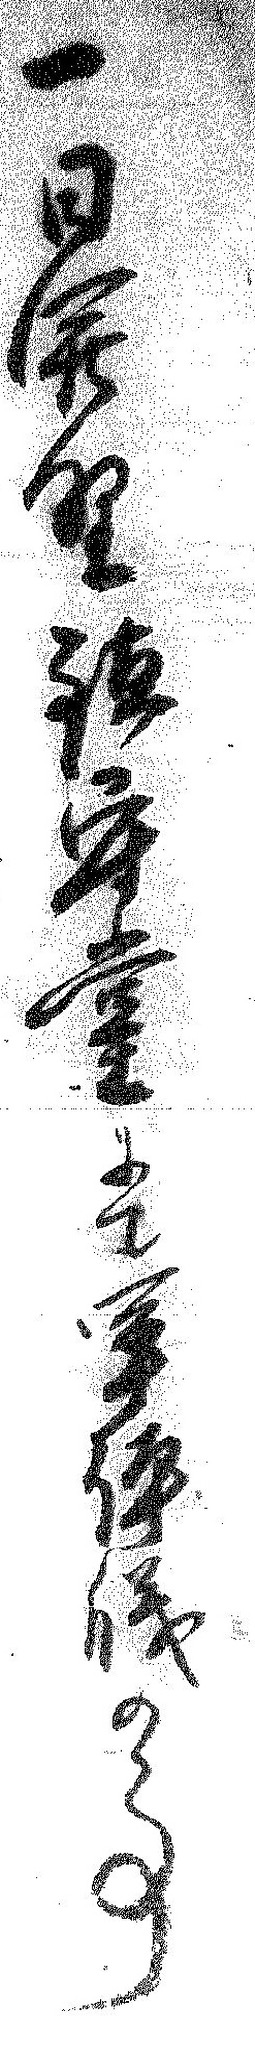一日開野鎮守堂にて軍評儀の事
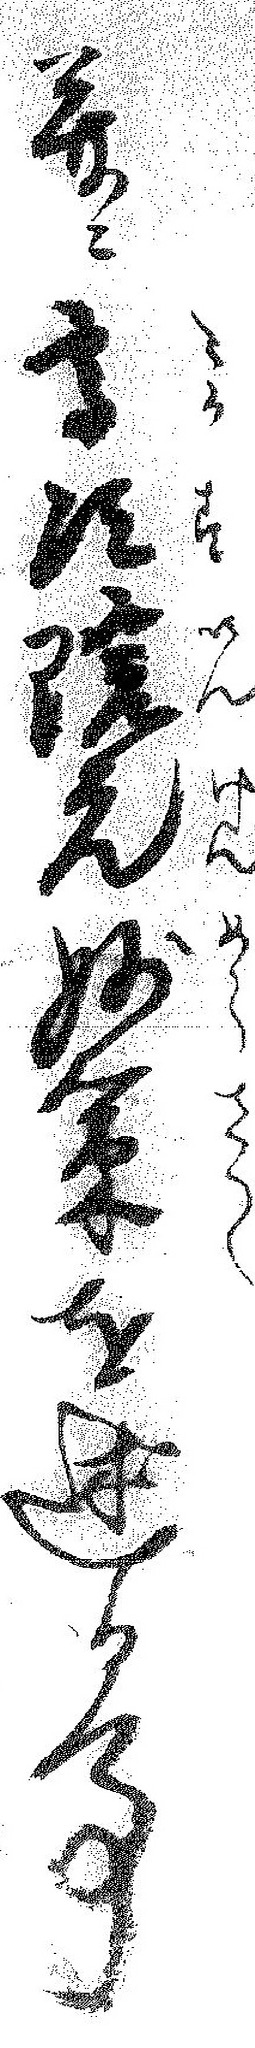幷に高須院元妙策を述る事
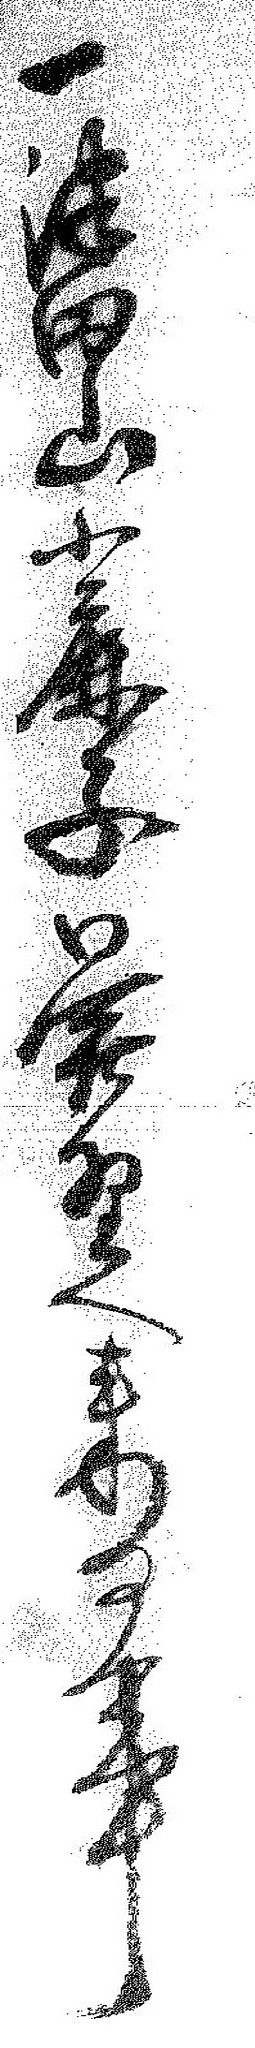一津田山小鹿子日開野へ来る事
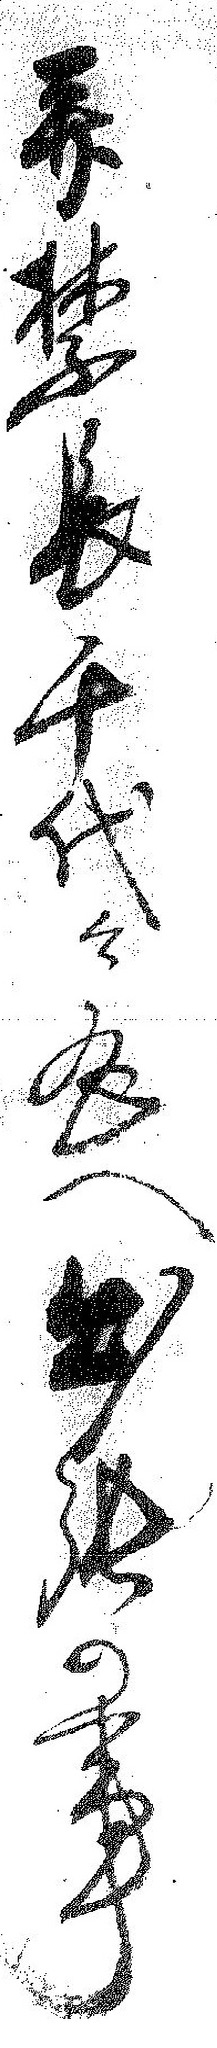幷禁長千代ヶ丸へ出張の事
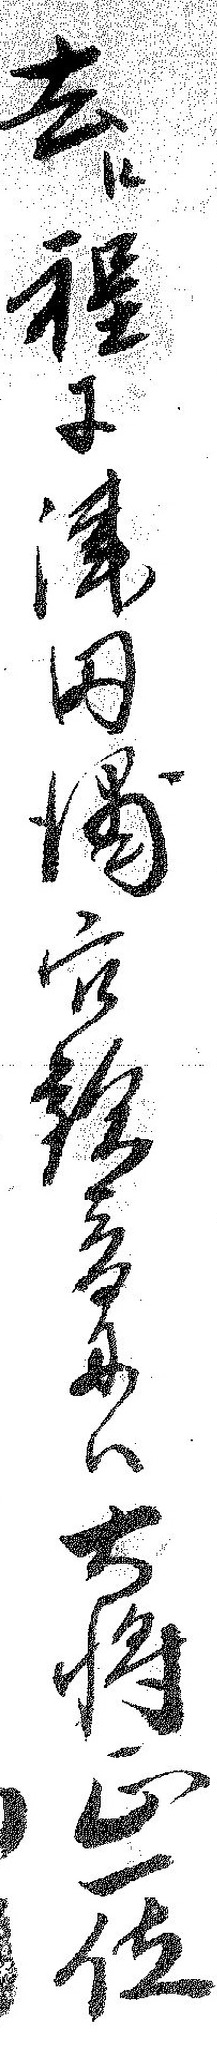去る程に津田浦穴観音には大将正一位
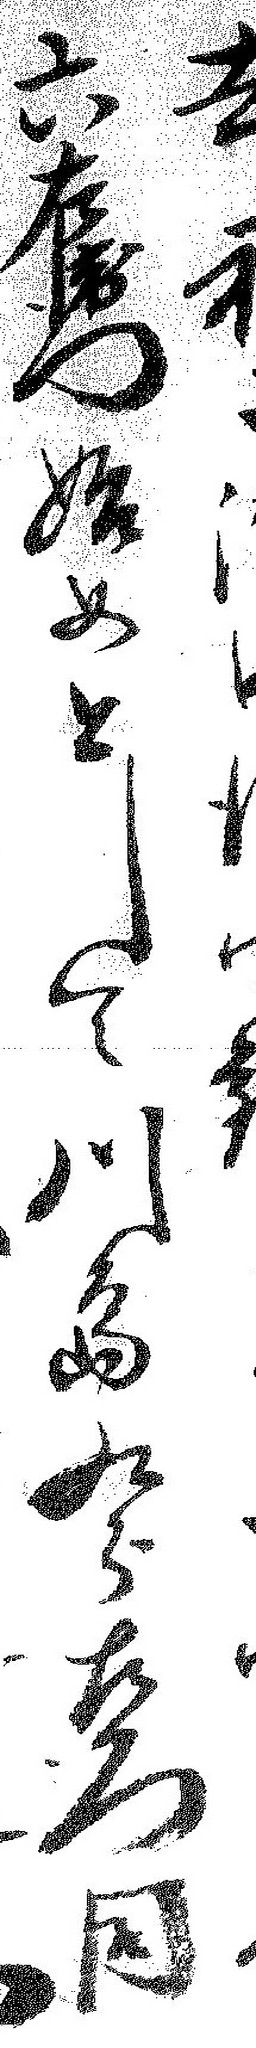六右衛門始めとして川島九郎左衛門同
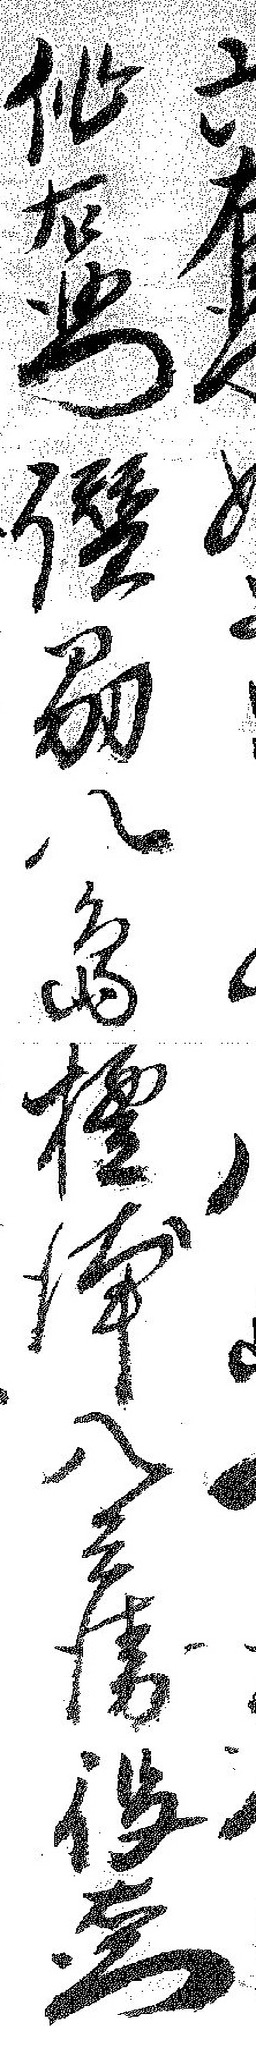作右衛門讃州八島檀浦八兵衛役右衛門
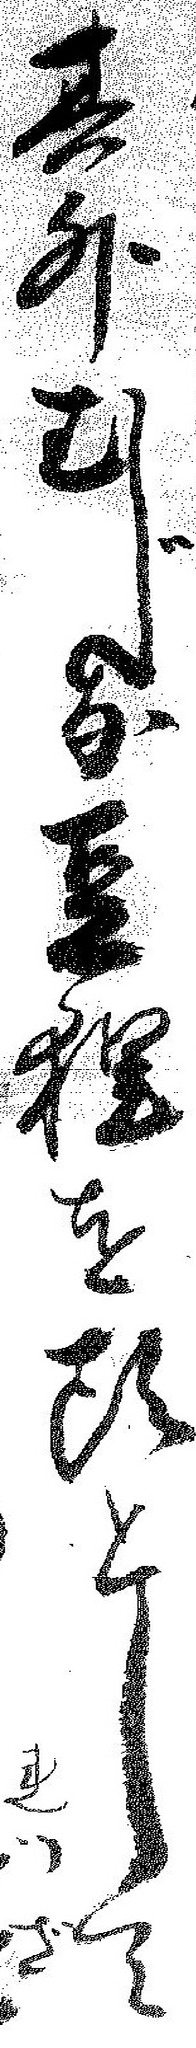其外むじな豆狸を頭として
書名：近頃古狸珍説　礼義智信
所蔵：徳島県立図書館
